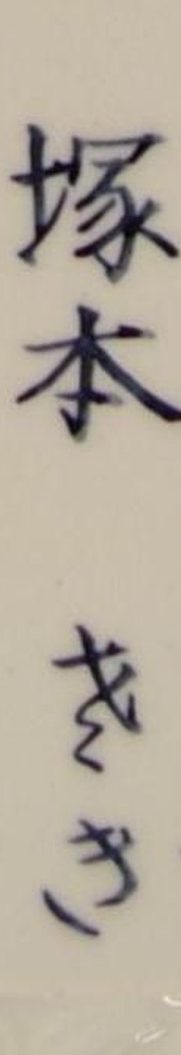塚本さき
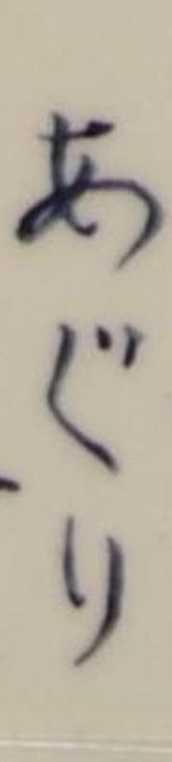あぐり
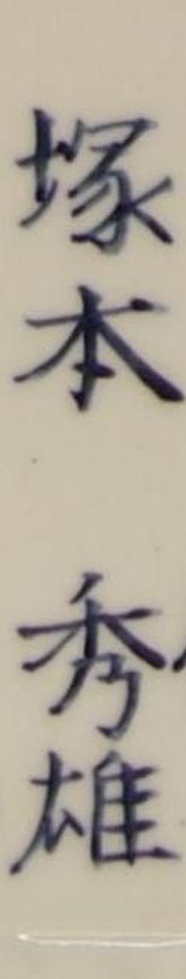塚本秀雄
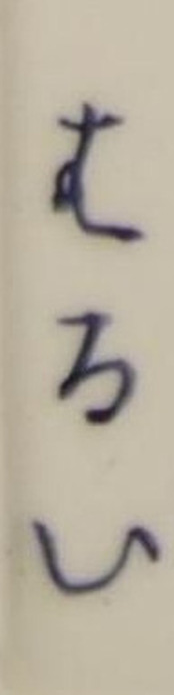はるい

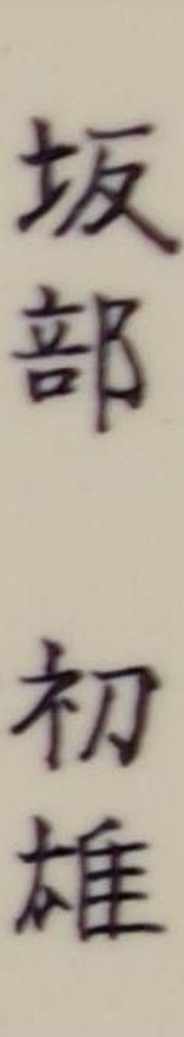坂部初雄
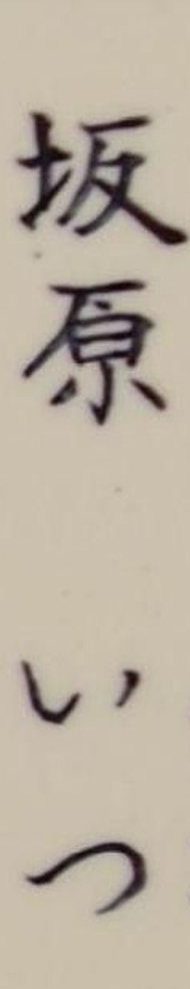坂原いつ
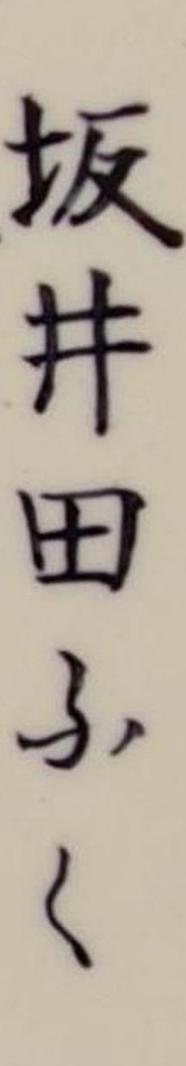坂井田ふく
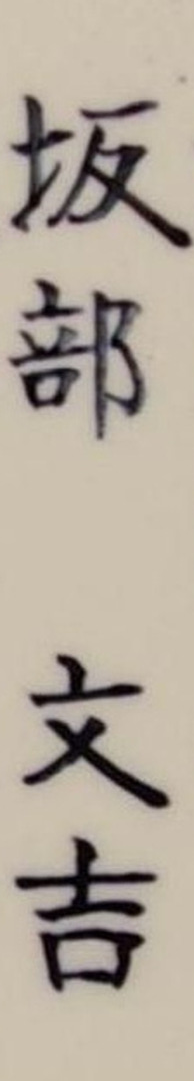坂部文吉
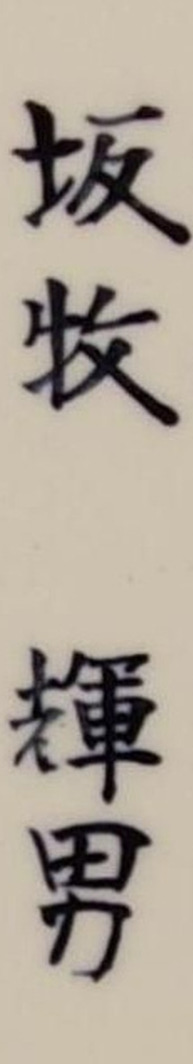坂牧輝男
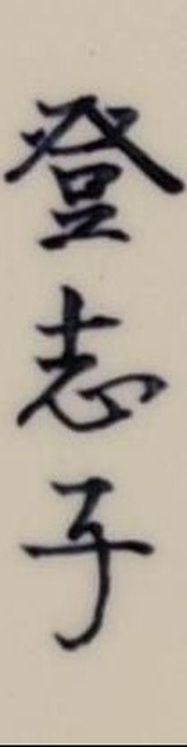登志子
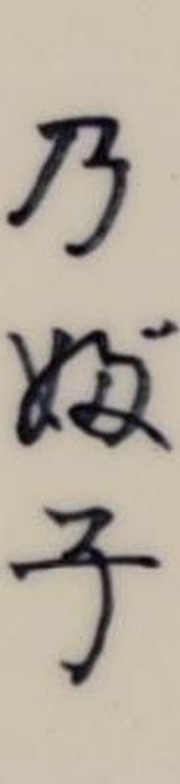のぶ子
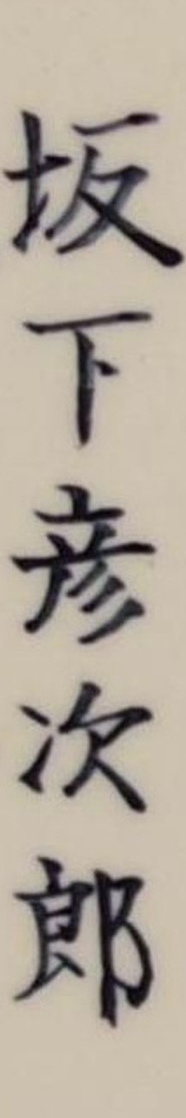坂下彦次郎
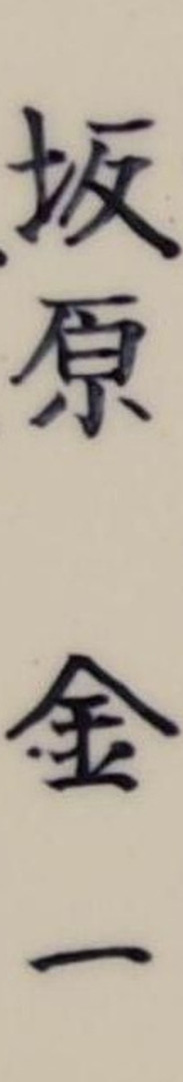坂原金一
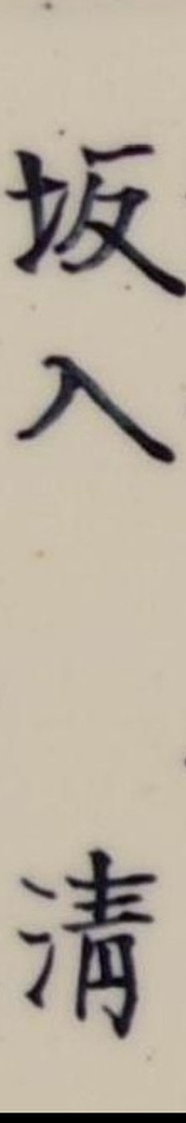坂入清
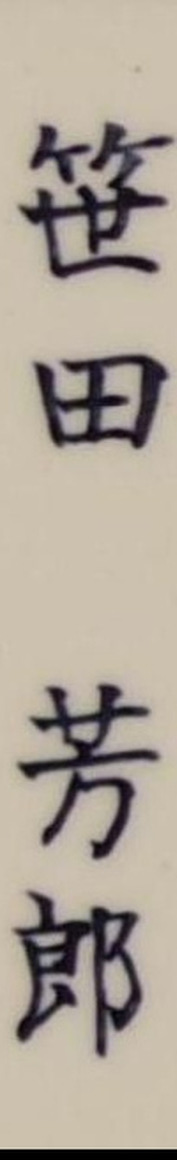笹田芳郎

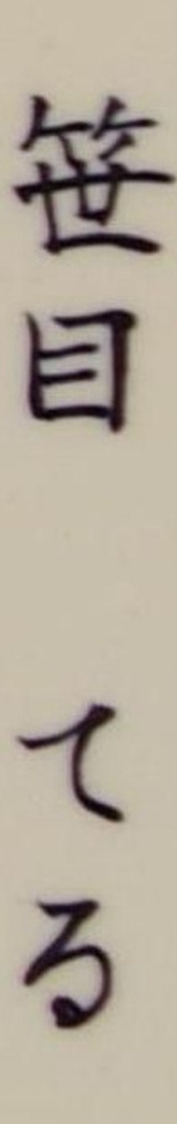笹目てる
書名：E~L
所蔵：高野山金剛峯寺
